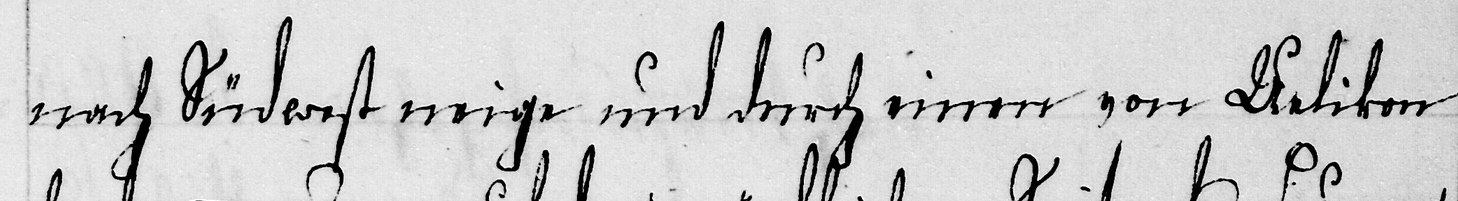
nach Südwest neige und durch einen von Uetikon
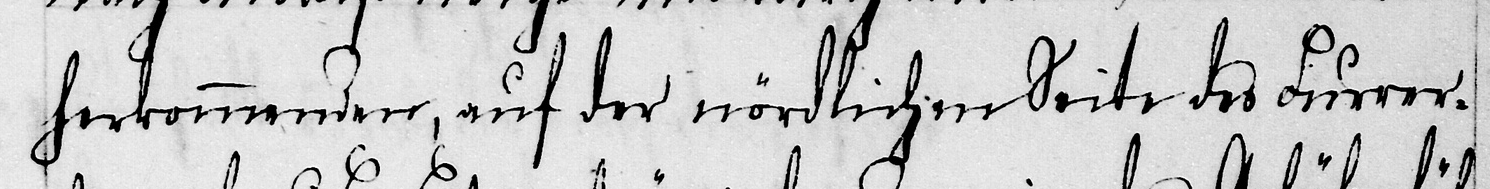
herkommenden, auf der nördlichen Seite des Furrer¬
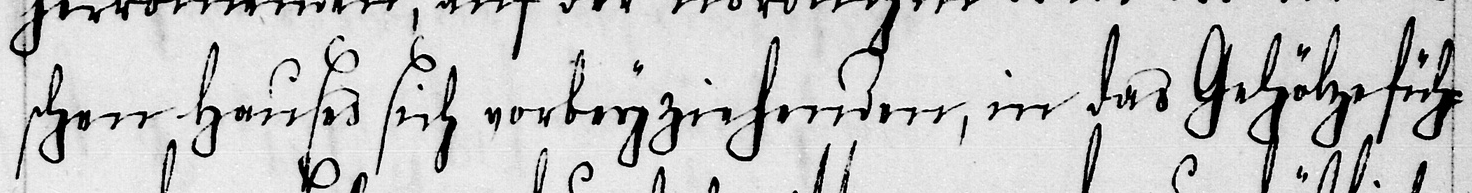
schen Hauses sich vorbeyziehenden, in das Gehölze füh¬
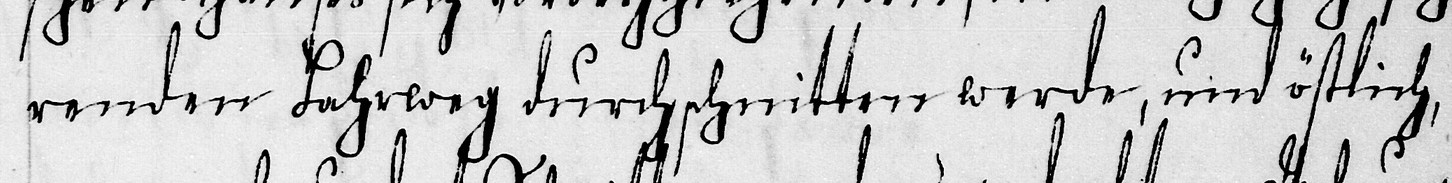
renden Fahrweg durchschnitten werde, und östlich,
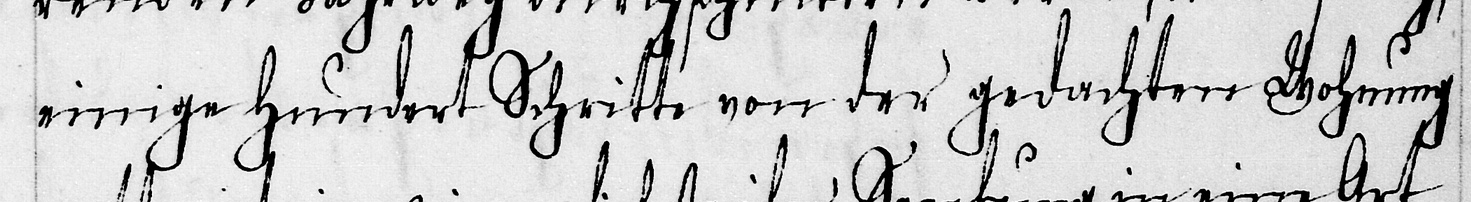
einige hundert Schritte von der gedachten Wohnung
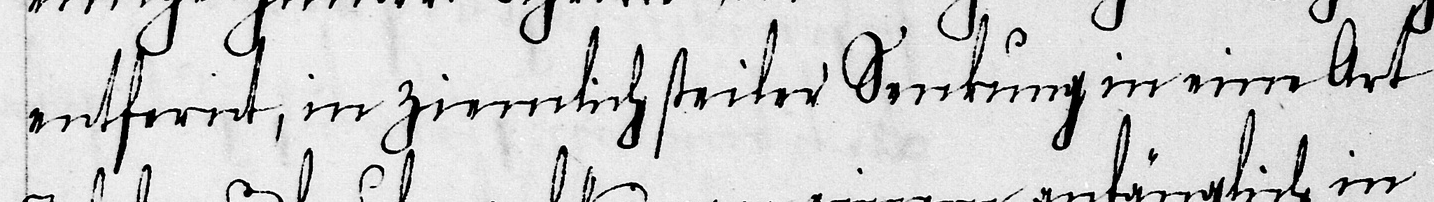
entfernt, in ziemlich steiler Senkung in eine Art
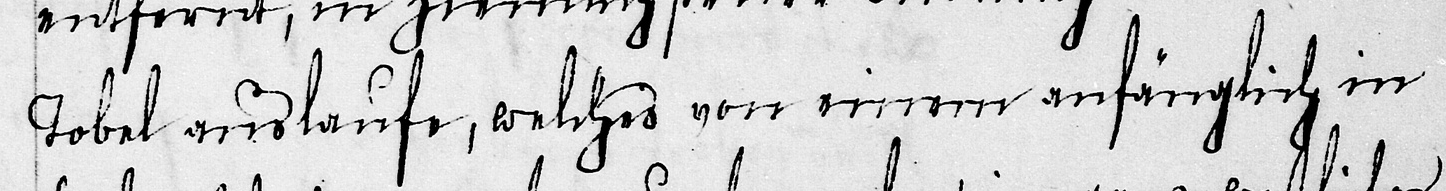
Tobel auslaufe, welches von einem anfänglich in
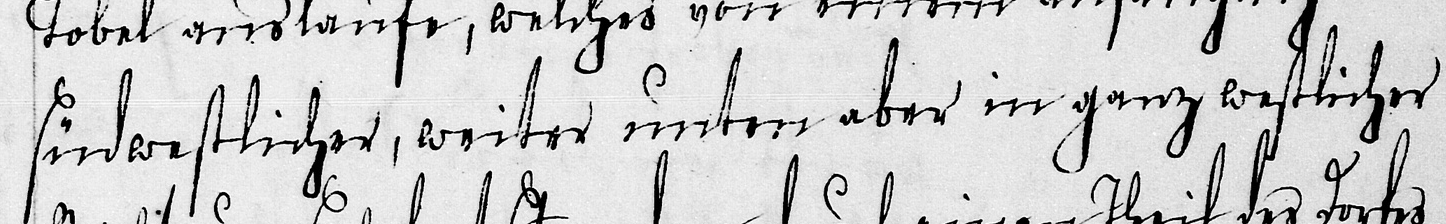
südwestlicher, weiter unten aber in ganz westlicher
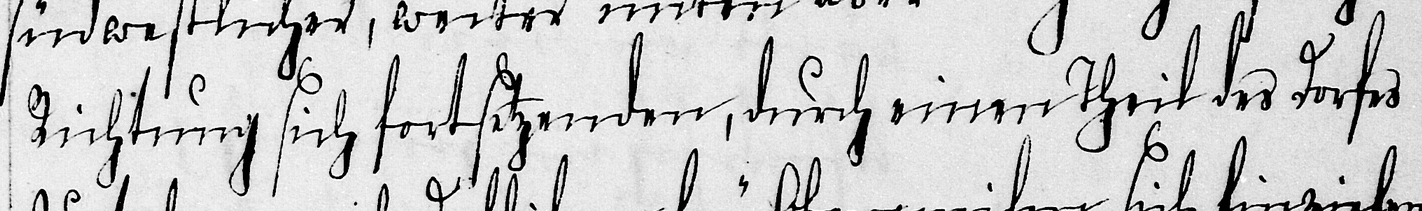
Richtung sich fortsetzenden, durch einen Theil des Dorfes
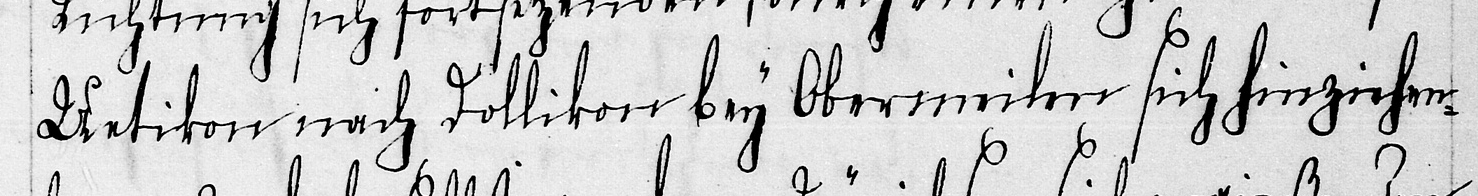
Uetikon nach Dollikon bey Obermeilen sich hinziehen¬
